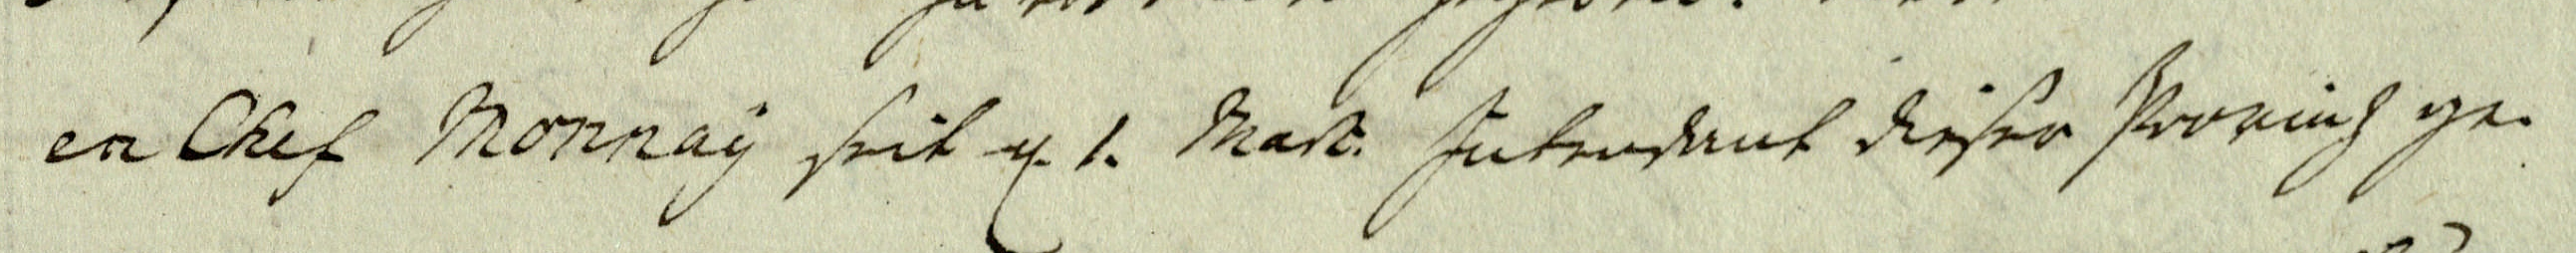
en Chef Monnaÿ seit d. 1. Mart. Intendant dieser Provinz ge¬
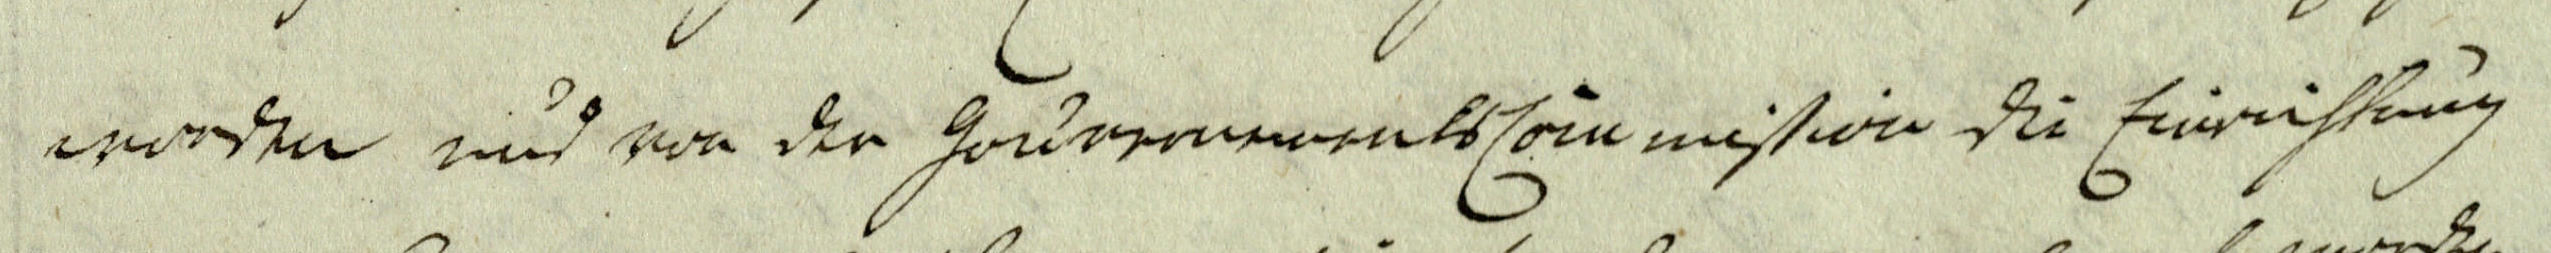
worden und von der GouvernementsCommission die Einrichtung
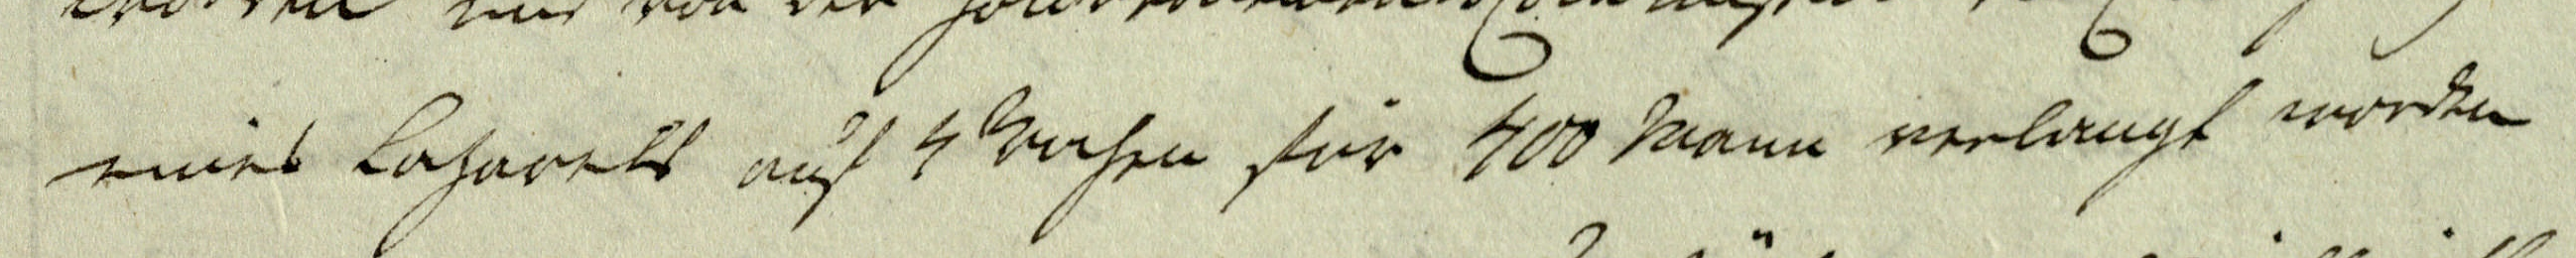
eines Lazarets auf 4 Wochen für 400 Mann verlangt worden
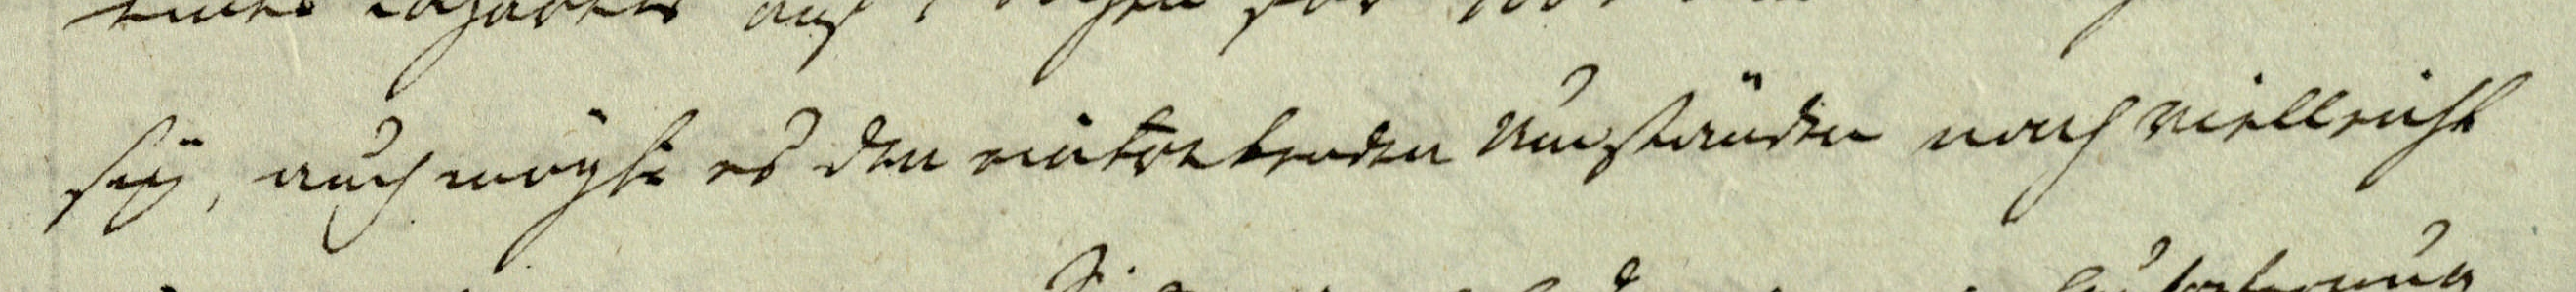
seÿ, auch mögte es den eintretenden Umständen nach vielleicht
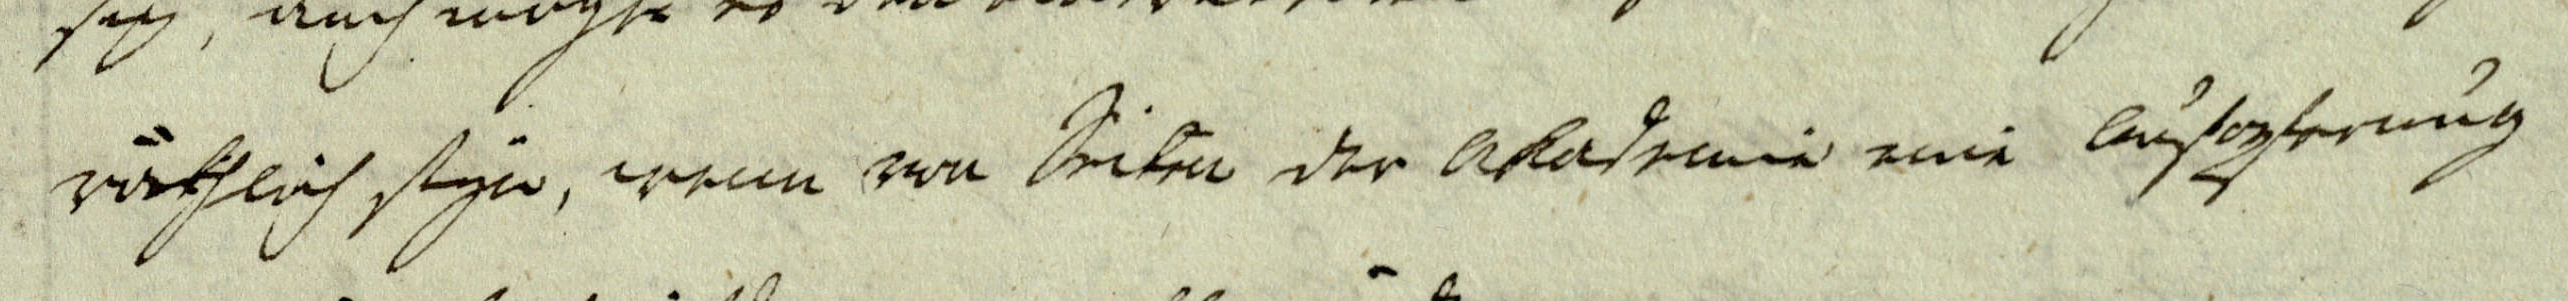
räthlich seÿn, wenn von Seiten der Akademie eine Aufopferung
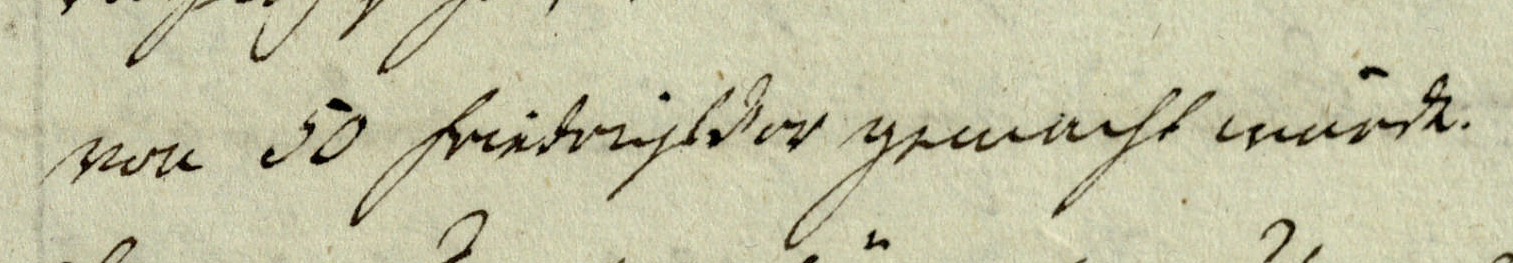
von 50 Friedrichsd'or gemacht würde.
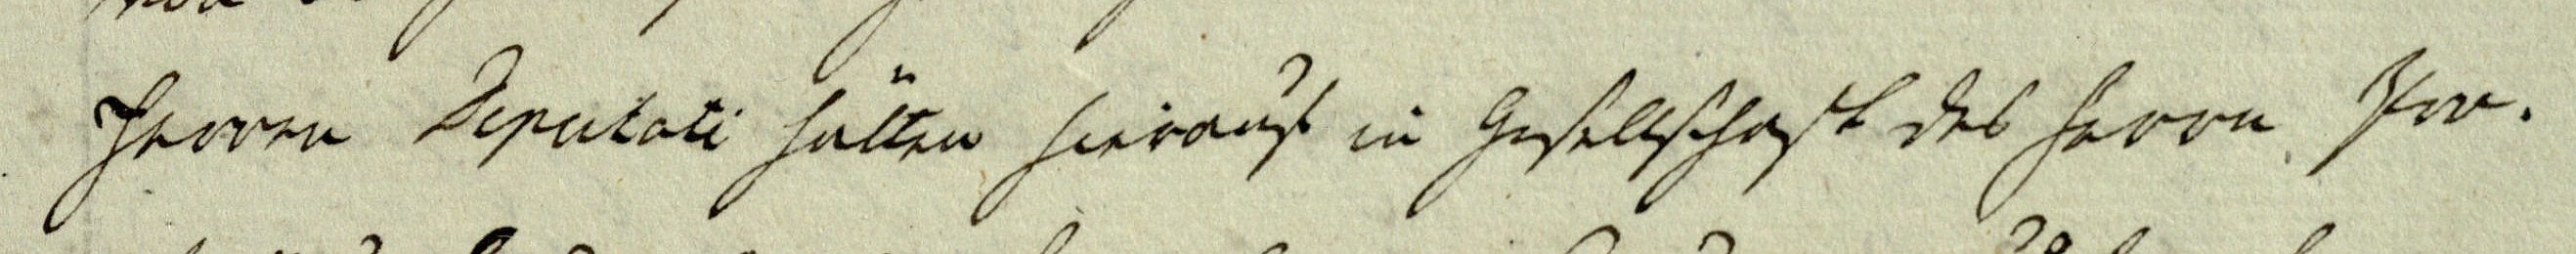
Herren Deputati hätten hierauf in Gesellschaft des Herrn Pro¬
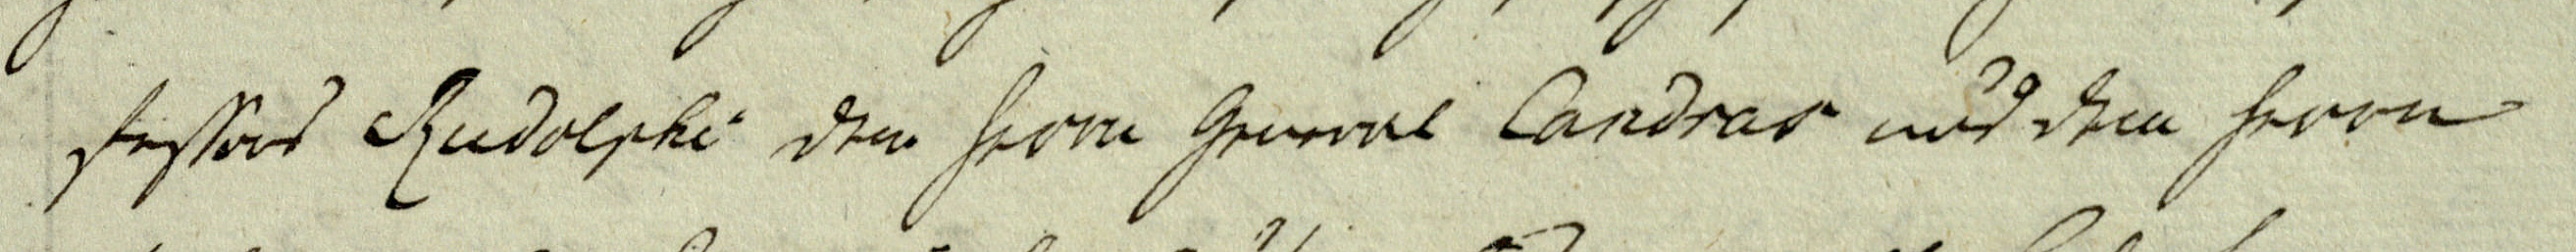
fessors Rudolphi dem Herrn General Candras und dem Herrn
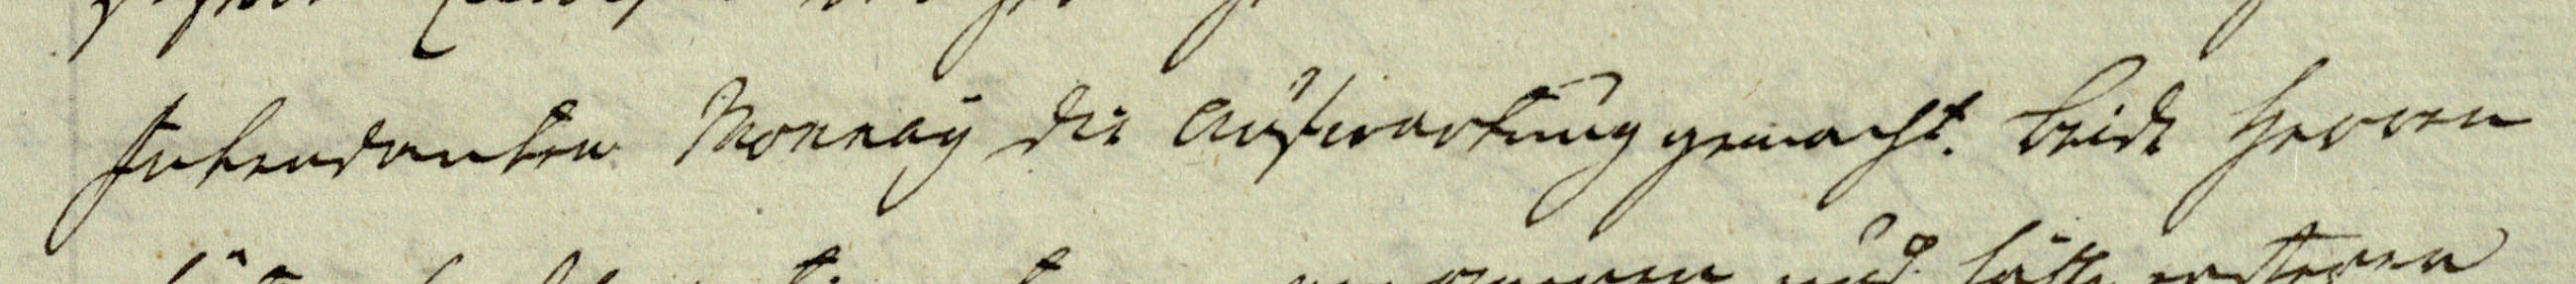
Intendanten Monnaÿ die Aufwartung gemacht. Beide Herren
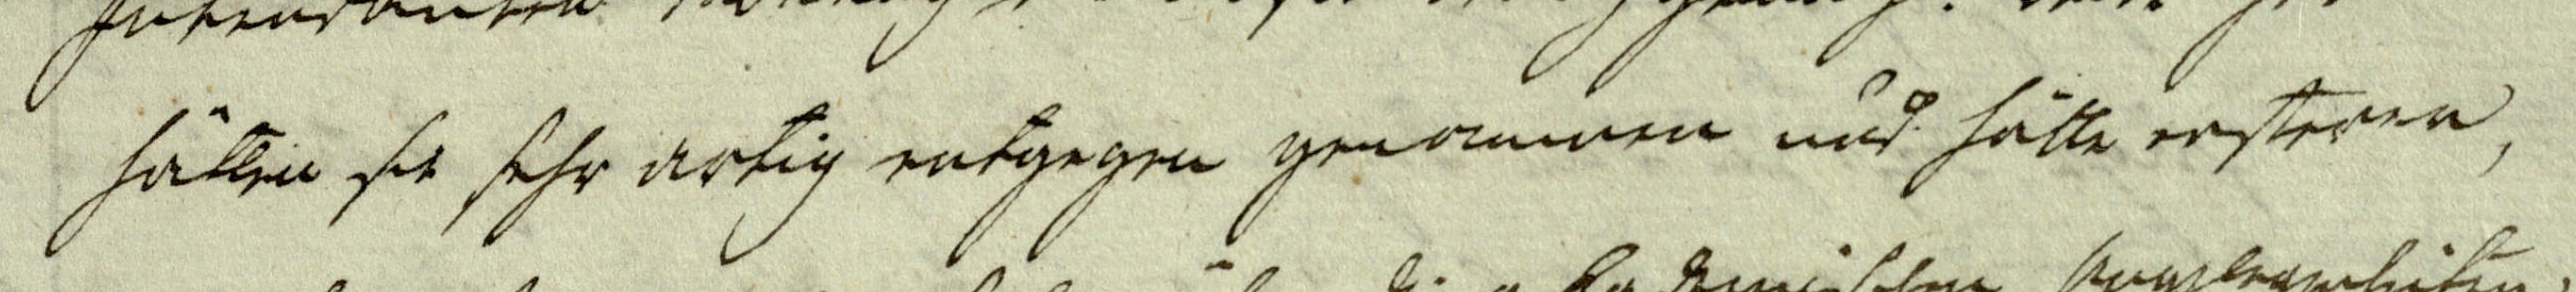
hätten sie sehr artig entgegen genommen und hätte ersterer,
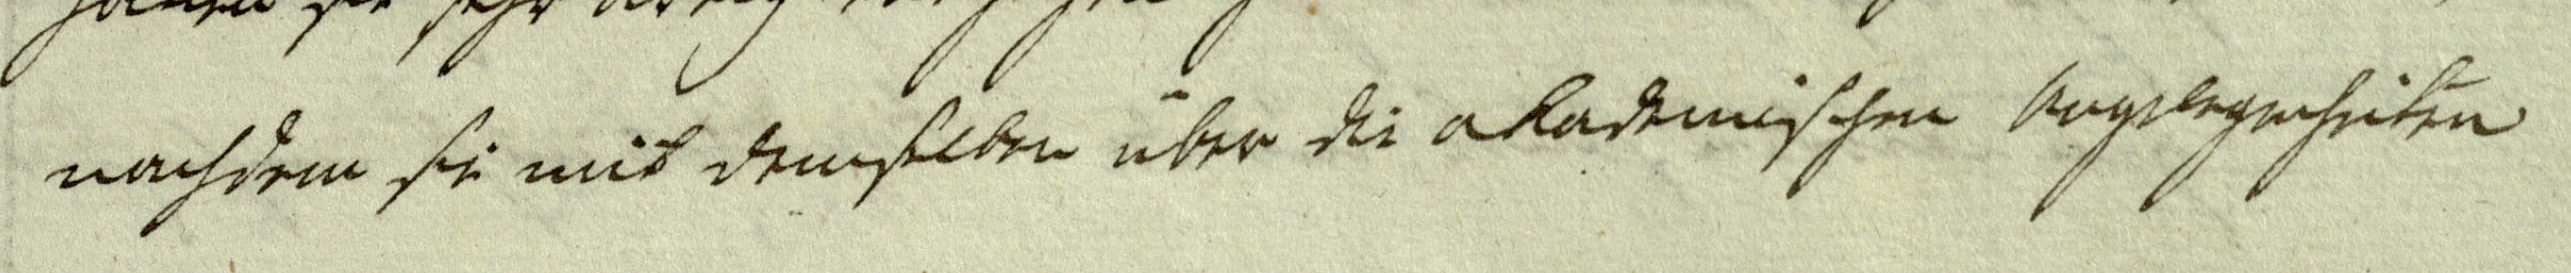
nachdem sie mit demselben über die akademischen Angelegenheiten
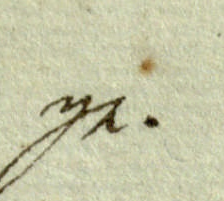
ge¬
